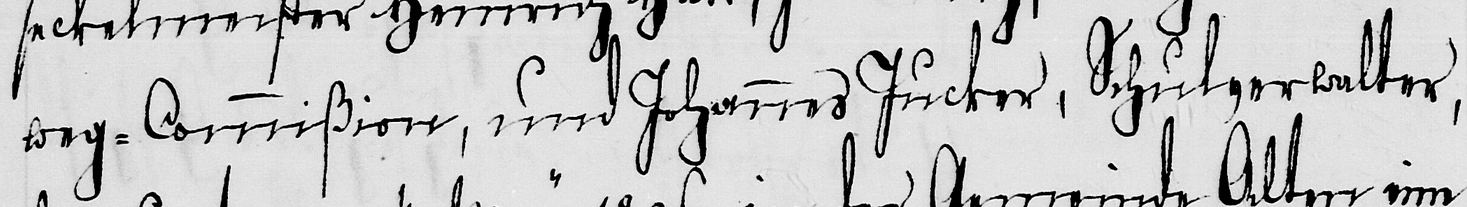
dweg-Commißion, und Johannes Jucker, Schulverwalter,
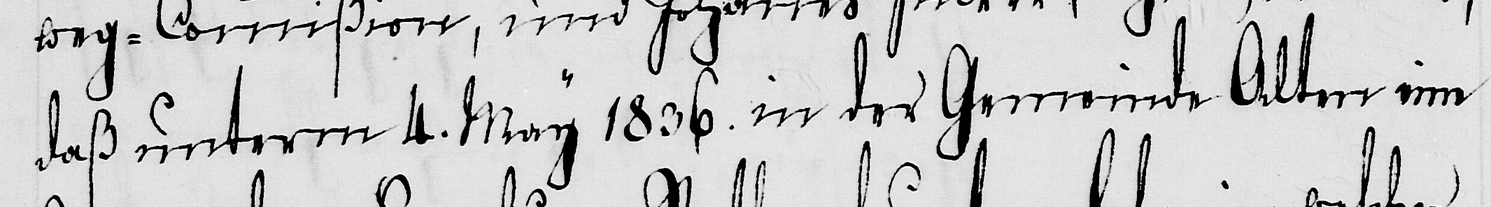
daß unterm 4. May 1836. in der Gemeinde Alten eine
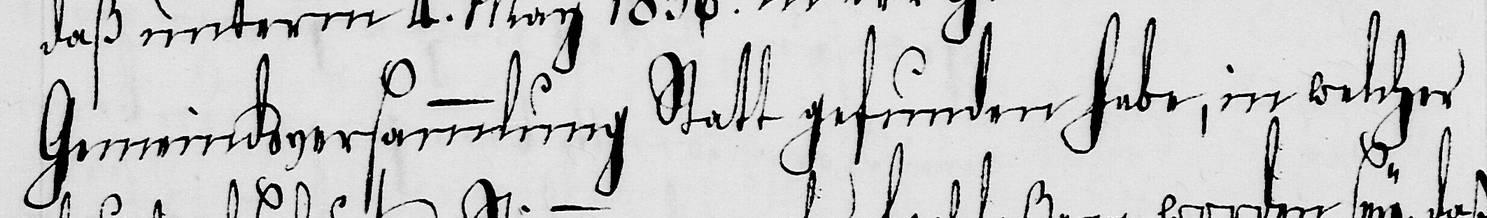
Gemeindsversammlung Statt gefunden habe, in welcher
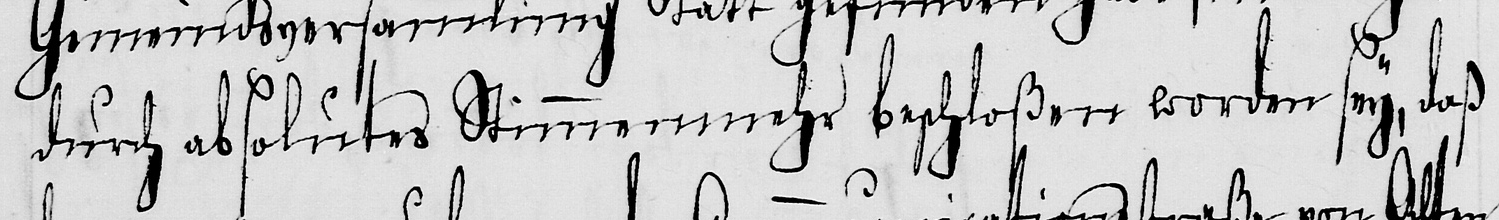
durch absolutes Stimmenmehr beschloßen worden sey, daß
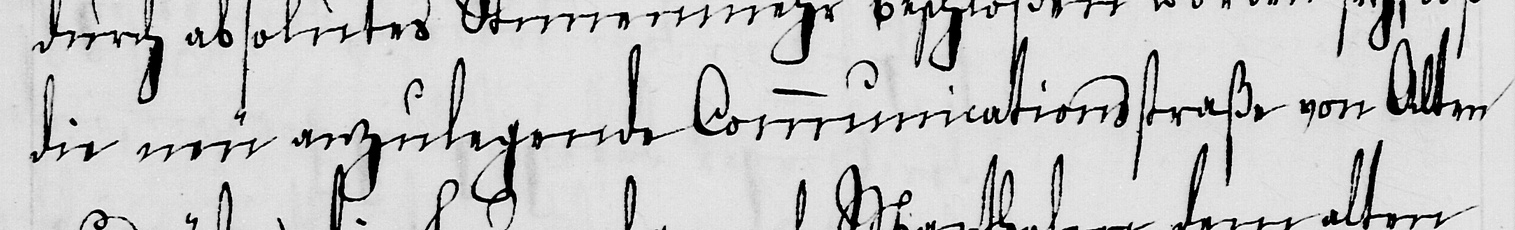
die neu anzulegende Communicationsstraße von Alten
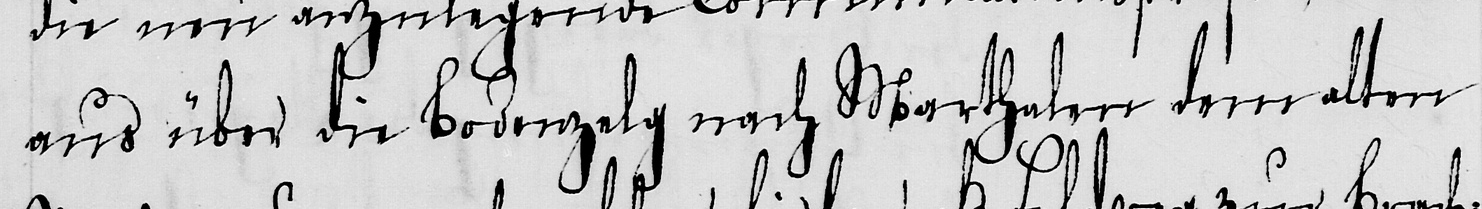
aus über die Bodenzelg nach Marthalen dem alten
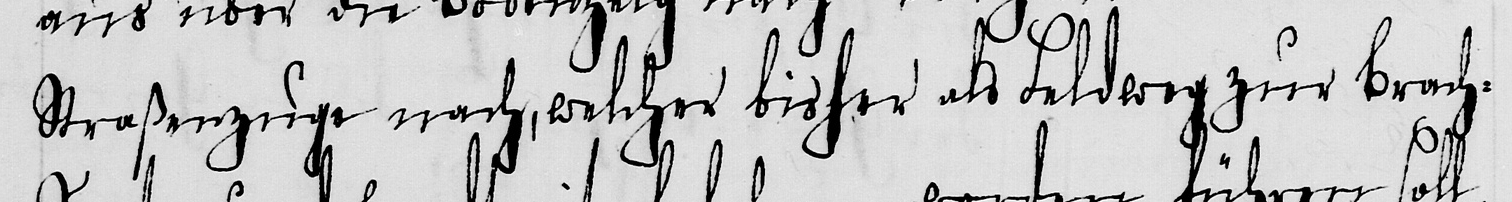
Straßenzuge nach, welcher bisher als Feldweg zur Brac¬
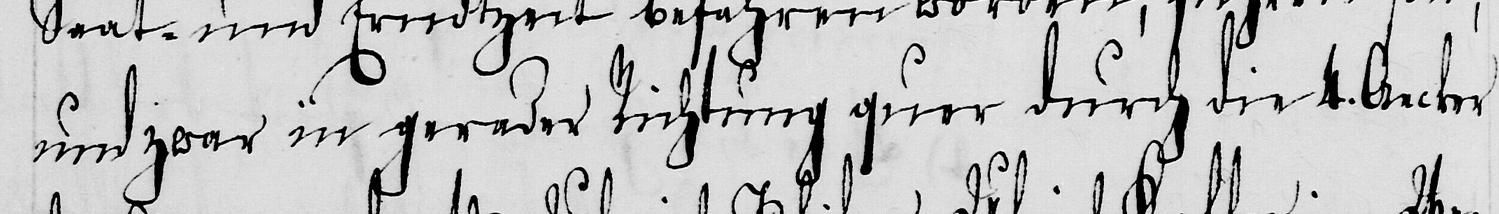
und zwar in gerader Richtung quer durch die 4. Aecker
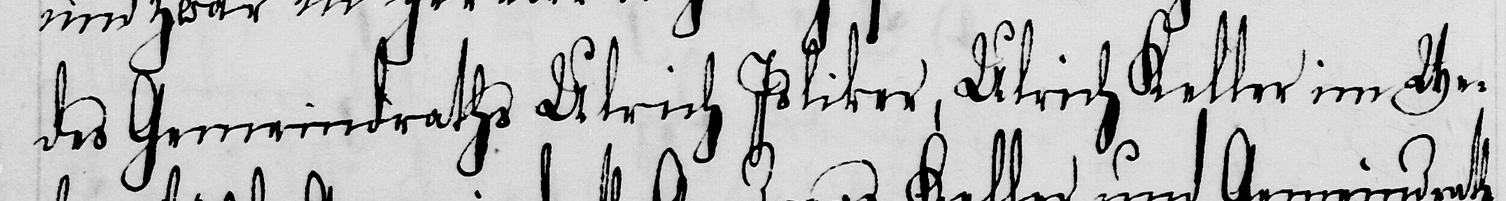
des Gemeindraths Ulrich Isliker, Ulrich Keller im We¬
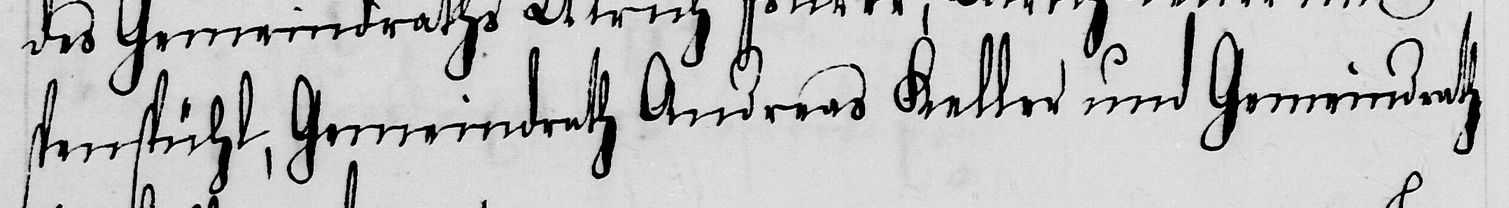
spenspühl, Gemeindrath Andreas Keller und Gemeindrath
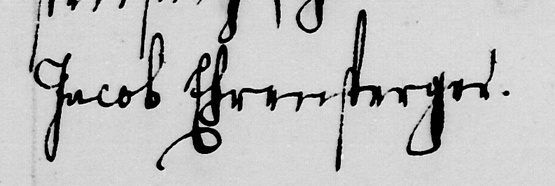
Jacob Ehrensperger.
